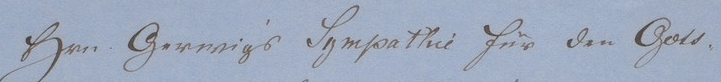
Hrn. Gerwig's Sympathie für den Gott-
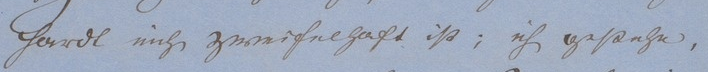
hardt nich zweifelhaft ist; ich gestehe,
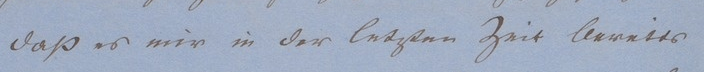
daß es mir in der letzten Zeit bereits
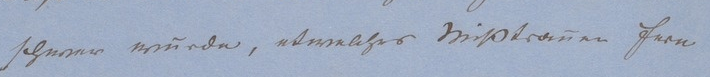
schwer wurde, etwelches Mißtrauen fern
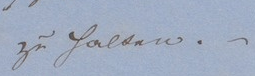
zu halten. –
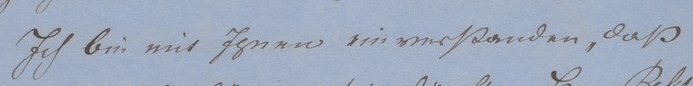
Ich bin mit Ihnen einverstanden, daß
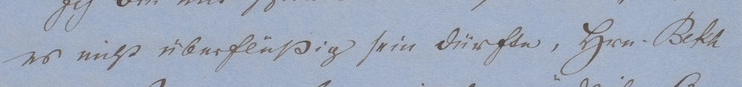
es nicht überflüßig sein dürfte, Hrn. Bekh
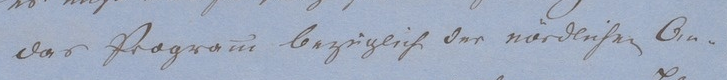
das Programm bezüglich der nördlichen An-
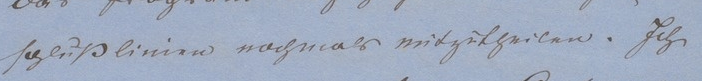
schlußlinien nochmals mitzutheilen. Ich
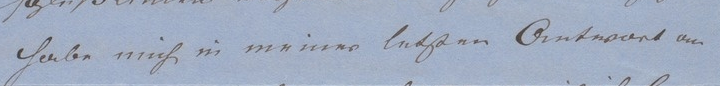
habe mich in meiner letzten Antwort an
